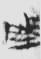陵
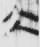大
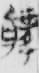痎
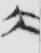大
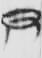尹
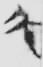帀（師）
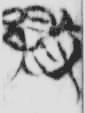○（尋）
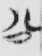公
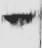丁
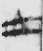士
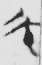帀（師）
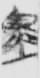墨
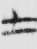士
